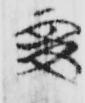妾
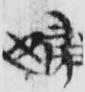婦
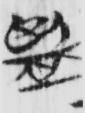監
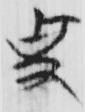史
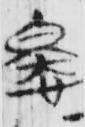懌
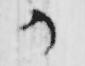人
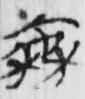秦
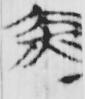赤
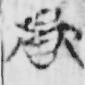晨
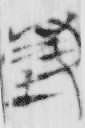○（隋）
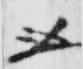之
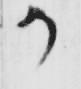人
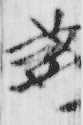惑
